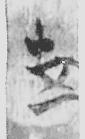{十五}
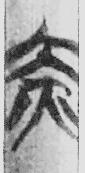赤
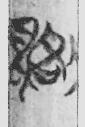{鳥咎}
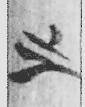之
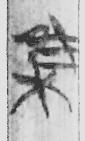集
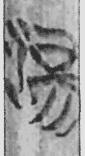湯
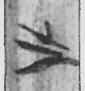之
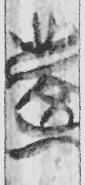{鹿至}
